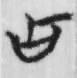占
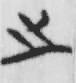之
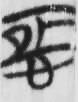恆
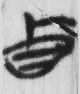貞
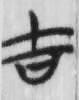吉
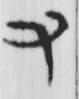又（有）
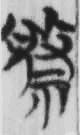○（敓）
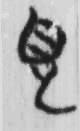見
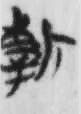新
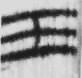王
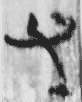父
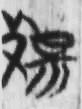○（殤）
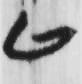㠯（以）
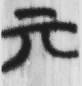亓（其）
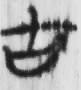古（故）
